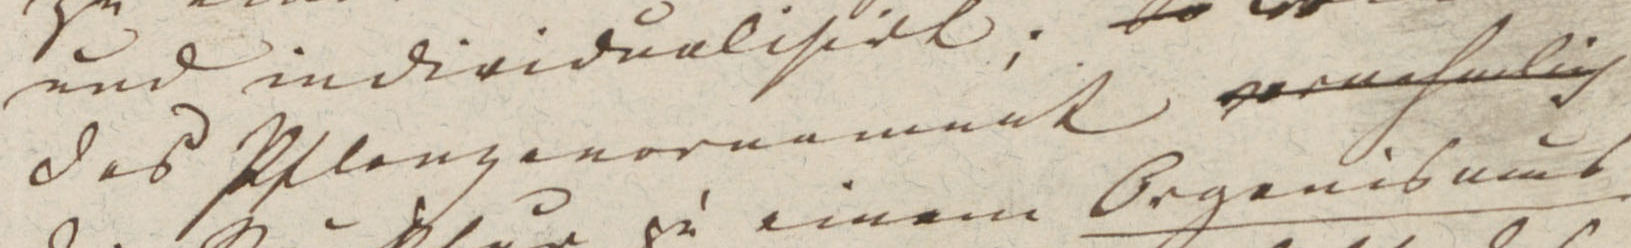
das Pflanzenornament vornehmlich
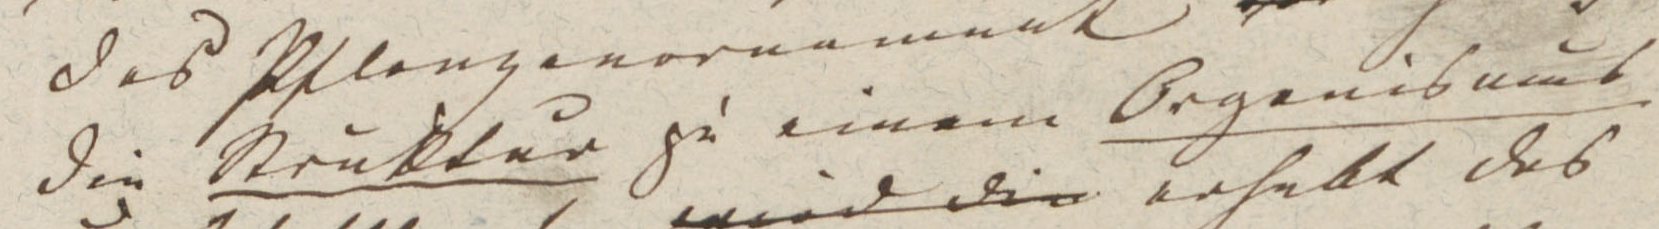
die Struktur zu einem Organismus
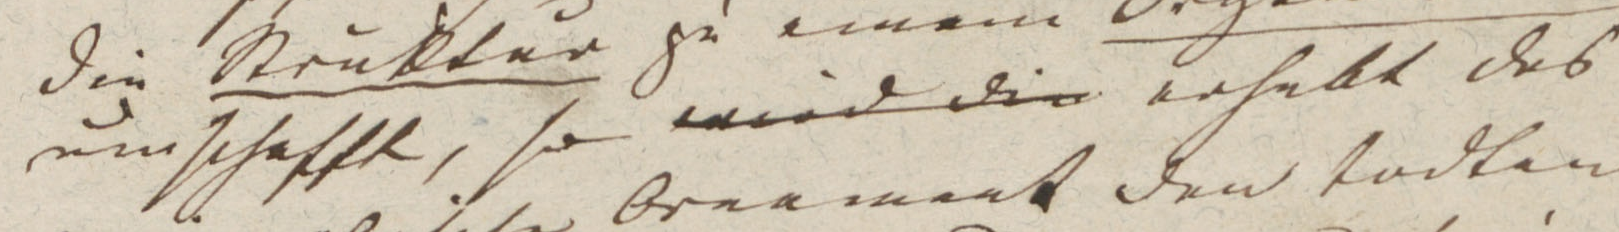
umschafft, so wird die erhebt das
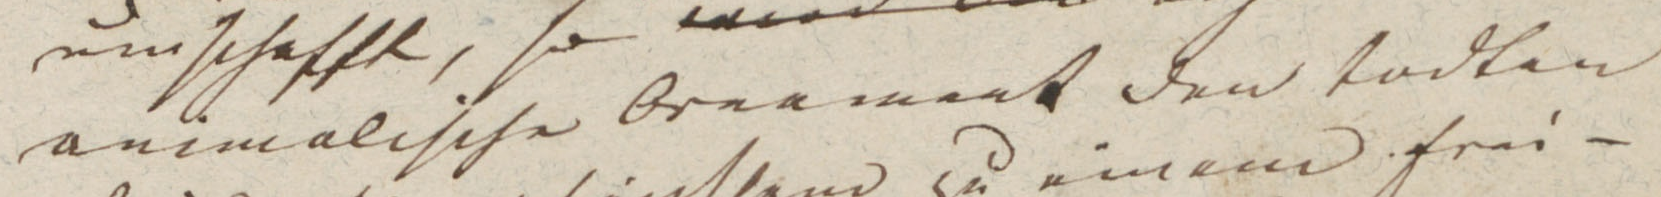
animalische Ornament den todten
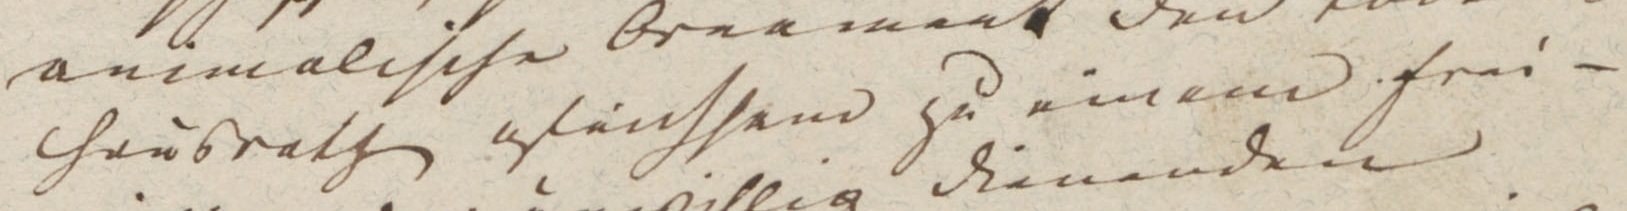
Hausrath gleichsam zu einem frei-
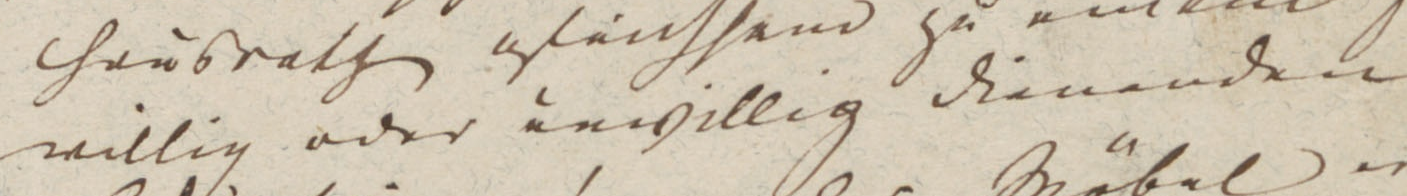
willig oder unwillig dienenden
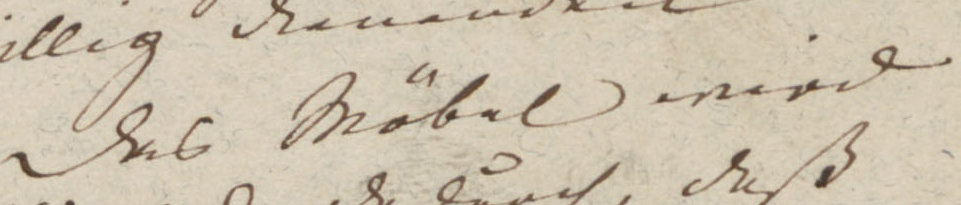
Das Möbel wird
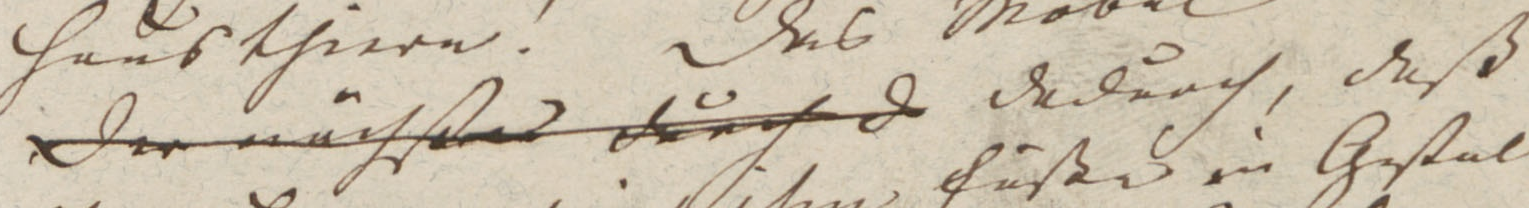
Der nächste durch d dadurch, dass
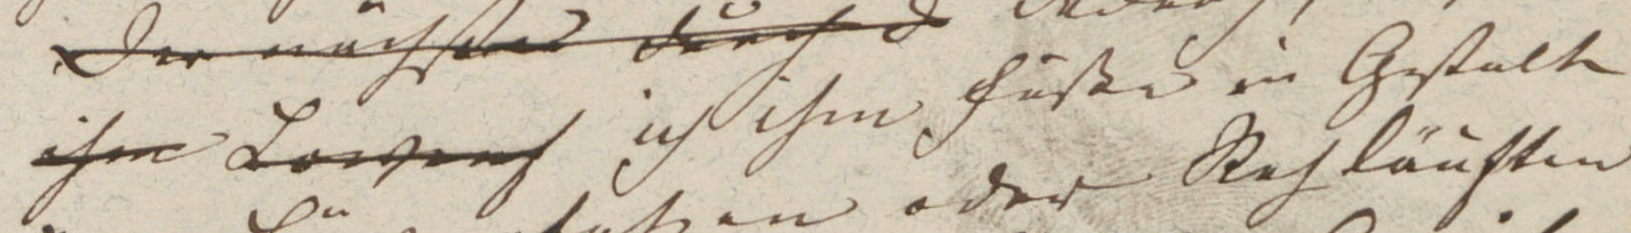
ihm Lowenf ich ihm Füsse in Gestalt
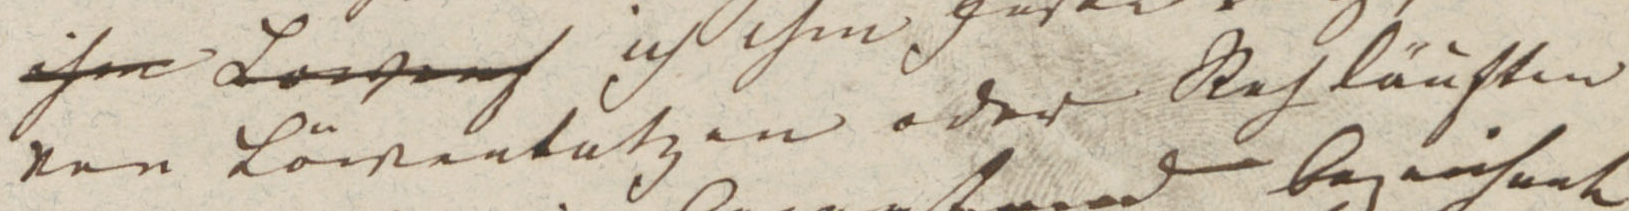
von Löwentatzen oder Rehläuften
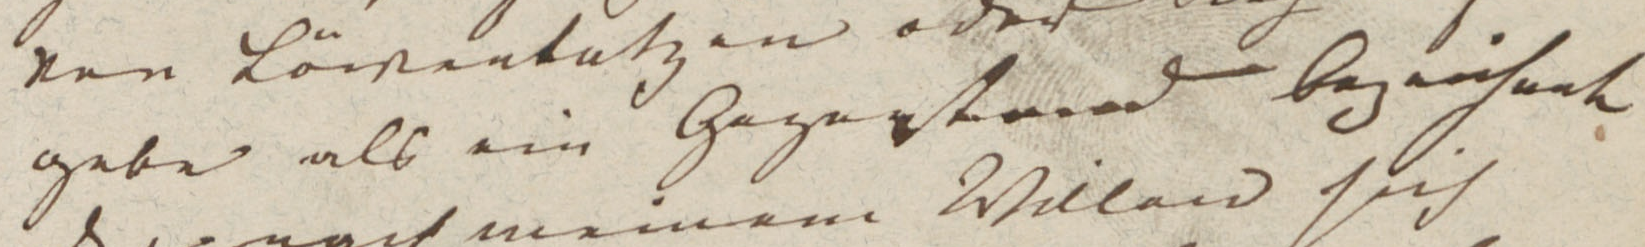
gebe als ein Gegenstand bezeichnet
